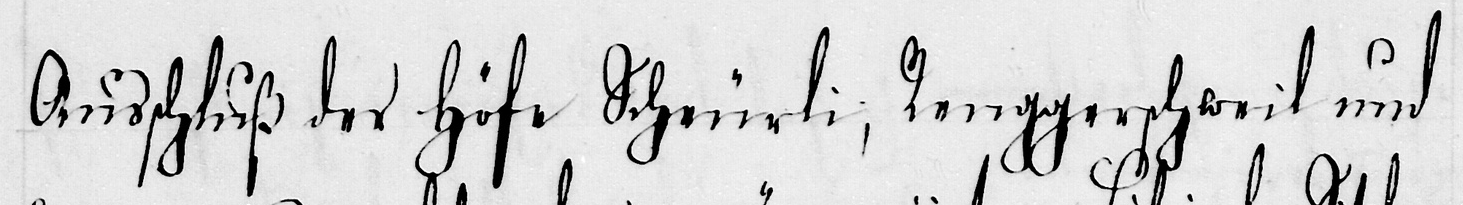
Ausschluß der Höfe Scheurli, Renggerschweil und
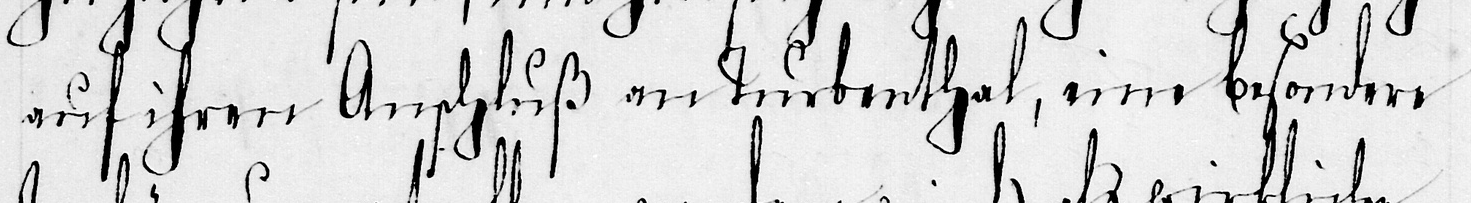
auf ihren Anschluß an Turbenthal, eine besondere
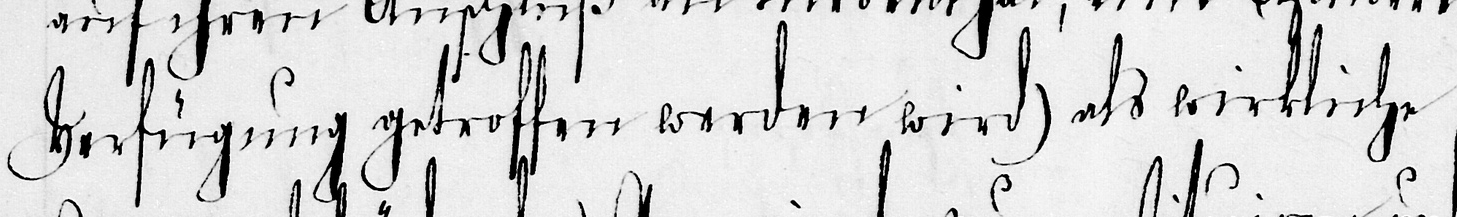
Verfügung getroffen werden wird) als wirkliche
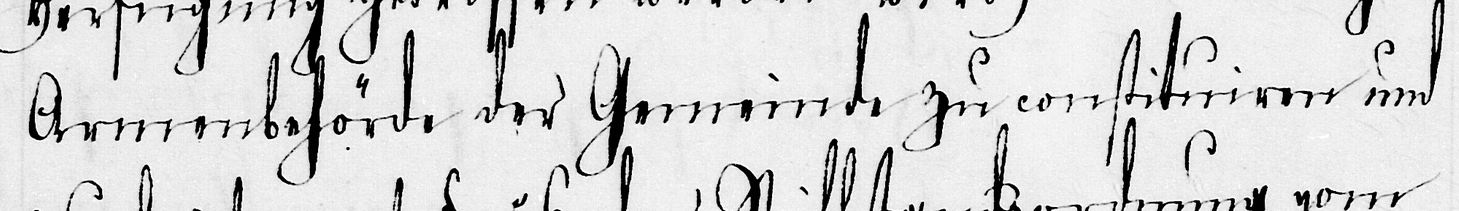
Armenbehörde der Gemeinde zu constituiren und
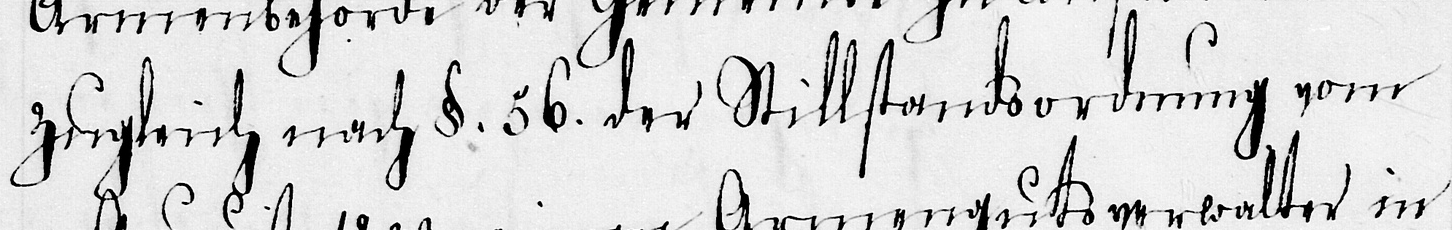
zugleich nach §. 56. der Stillstandsordnung vom
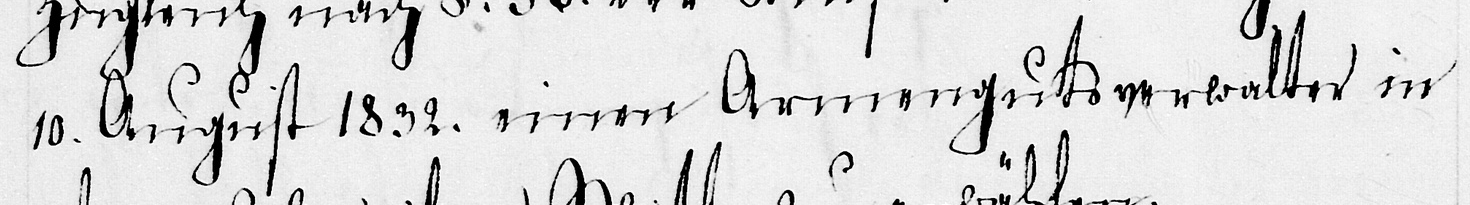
10. August 1832. einen Armengutsverwalter in
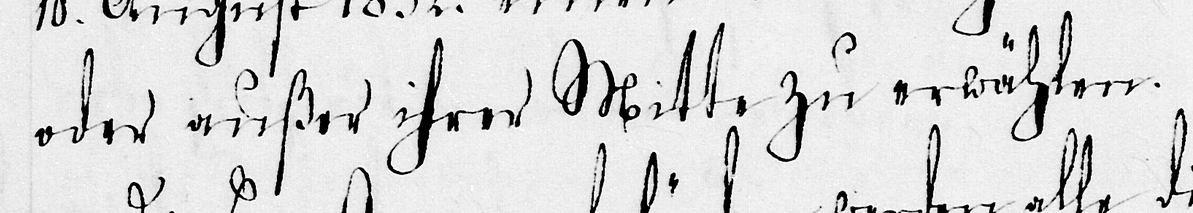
oder außer ihrer Mitte zu erwählen.
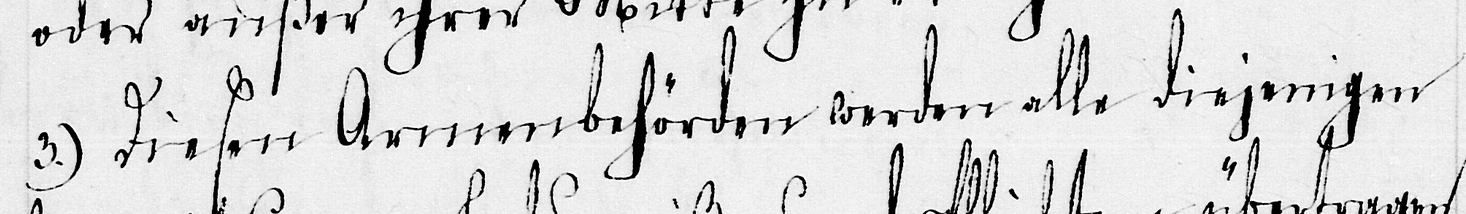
3.) Diesen Armenbehörden werden alle diejenigen
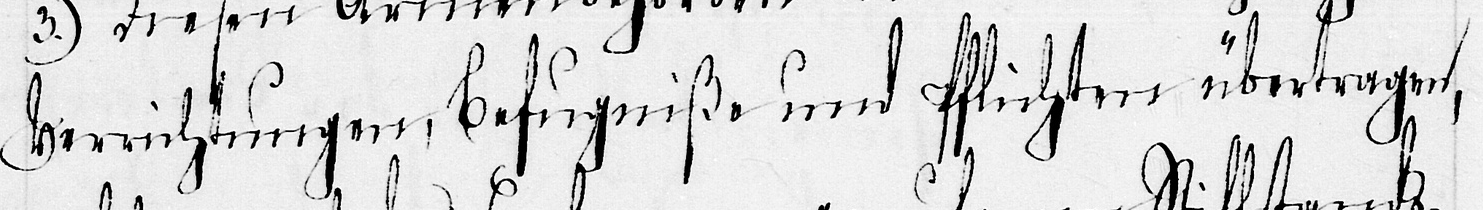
Verrichtungen, Befugniße und Pflichten übertragen,
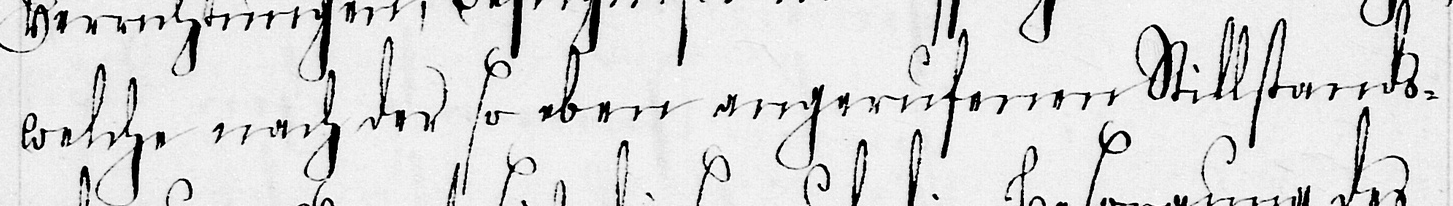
welche nach der so eben angerufenen Stillstands¬
